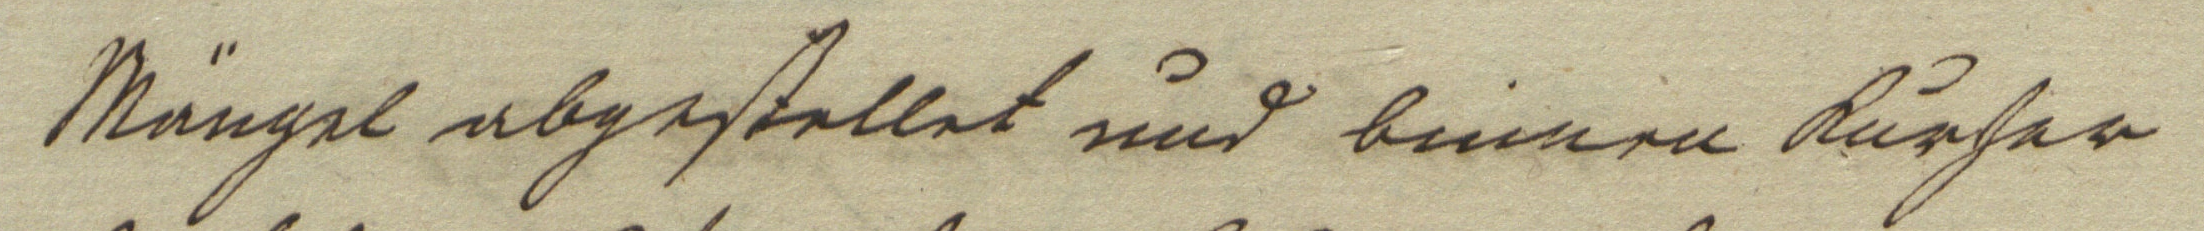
Mängel abgestellet und binnen kurzer
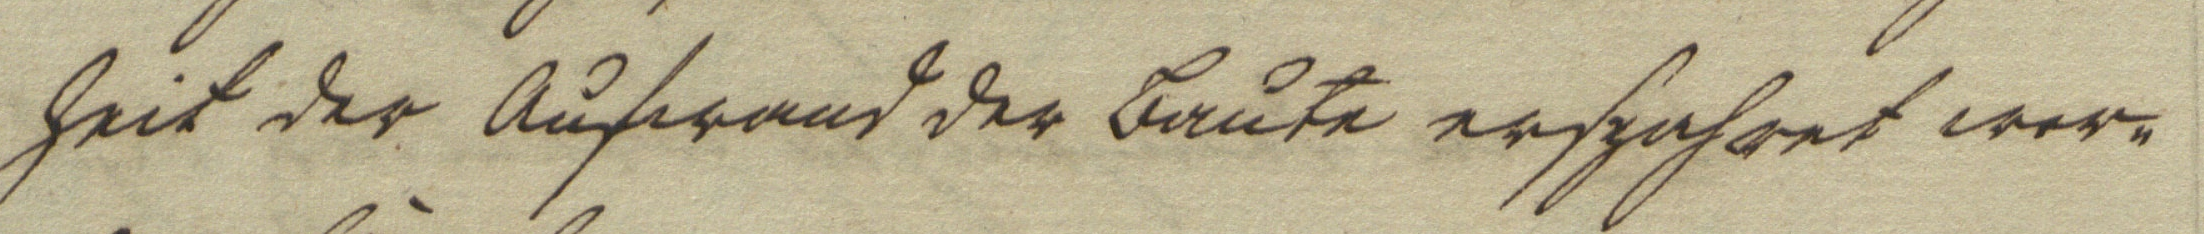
Zeit der Aufwand der Baute erspahret wer¬
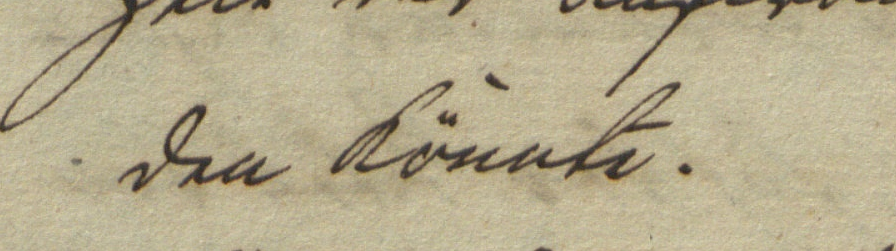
den könnte.
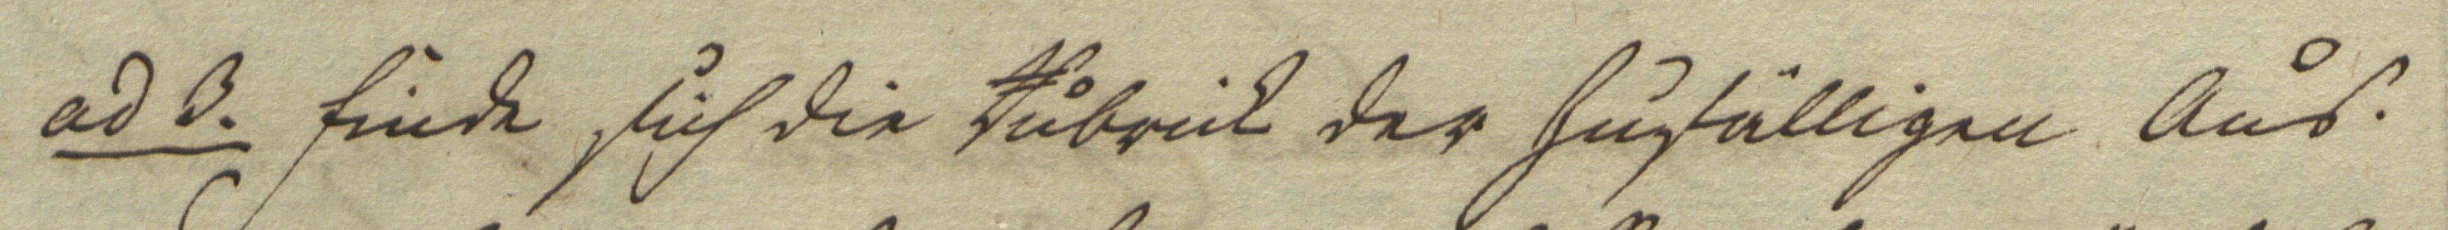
ad 3. Finde sich die Rubrik der zufälligen Aus¬
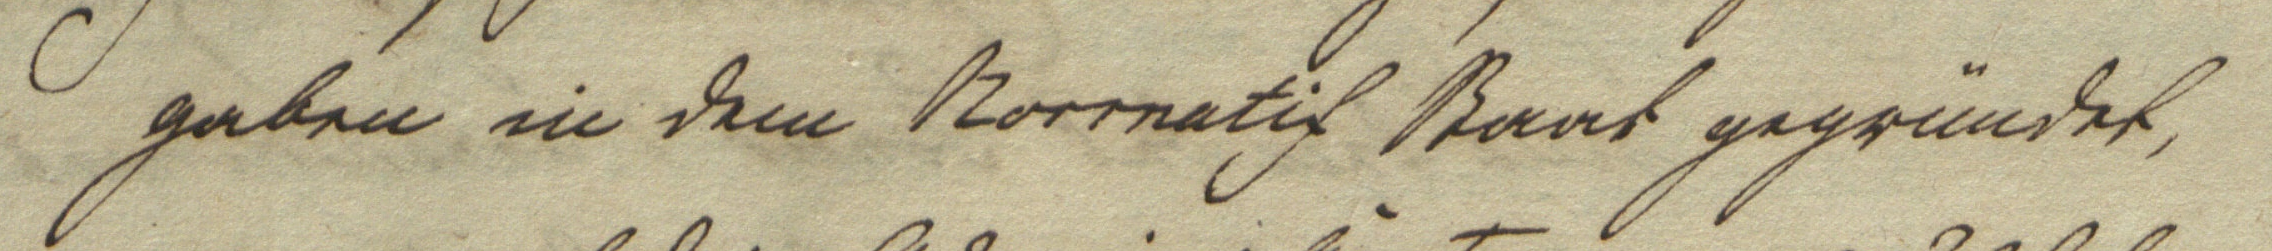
gaben in dem Normatif Staat gegründet,
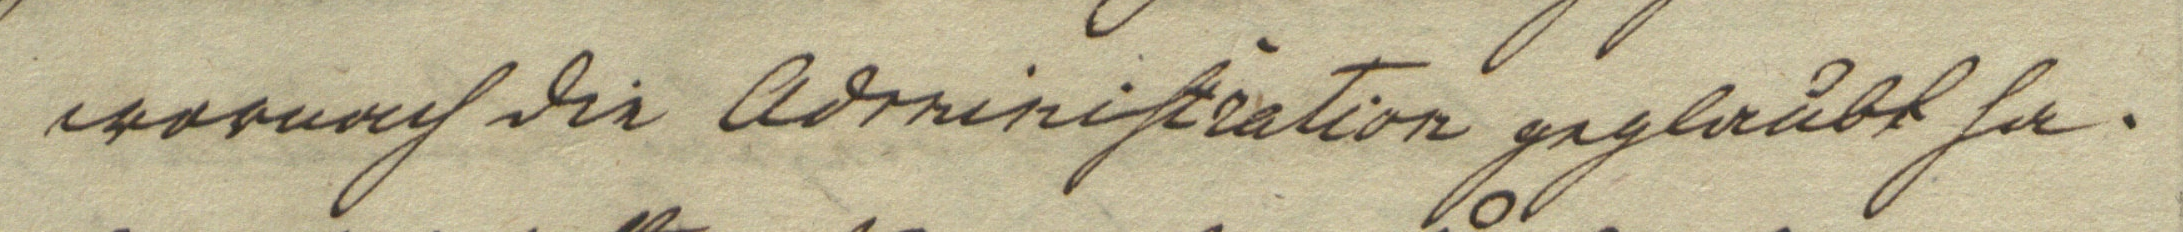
wornach die Administration geglaubt ha¬
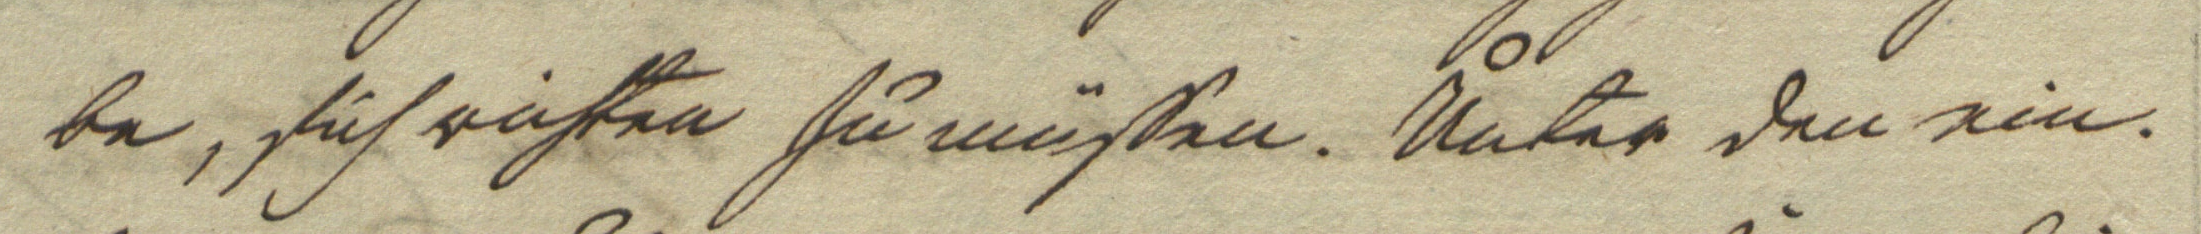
be, sich richten zu müssen. Unter den ein¬
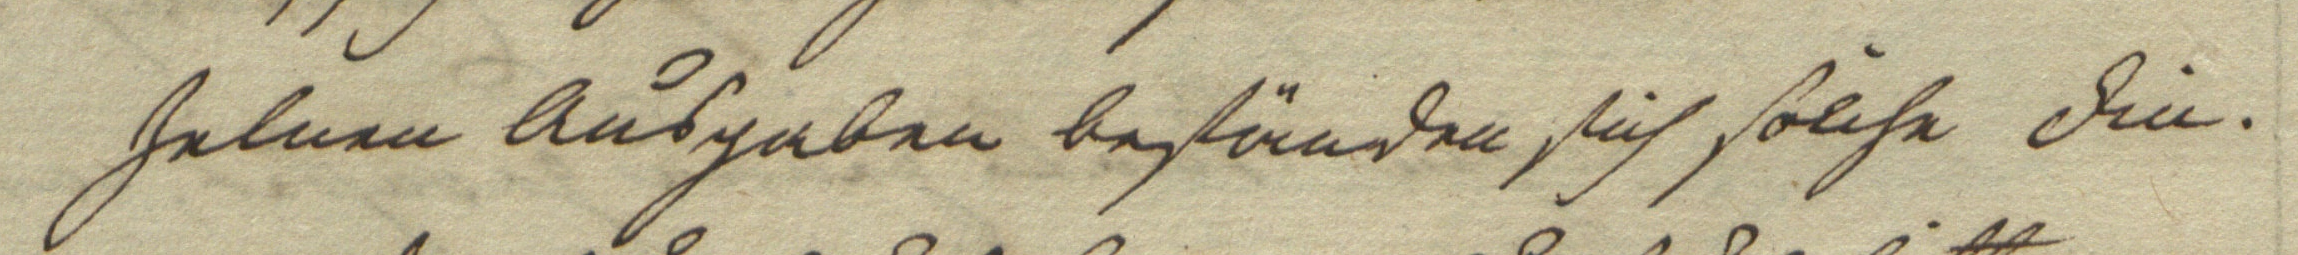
zelnen Ausgaben befänden sich solche Din¬
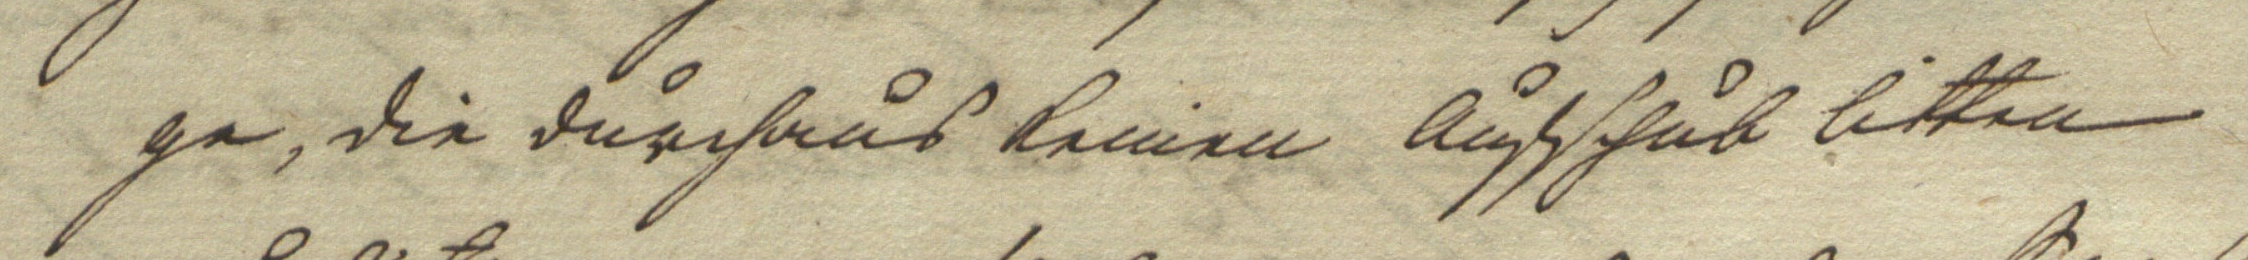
ge, die durchaus keinen Aufschub litten
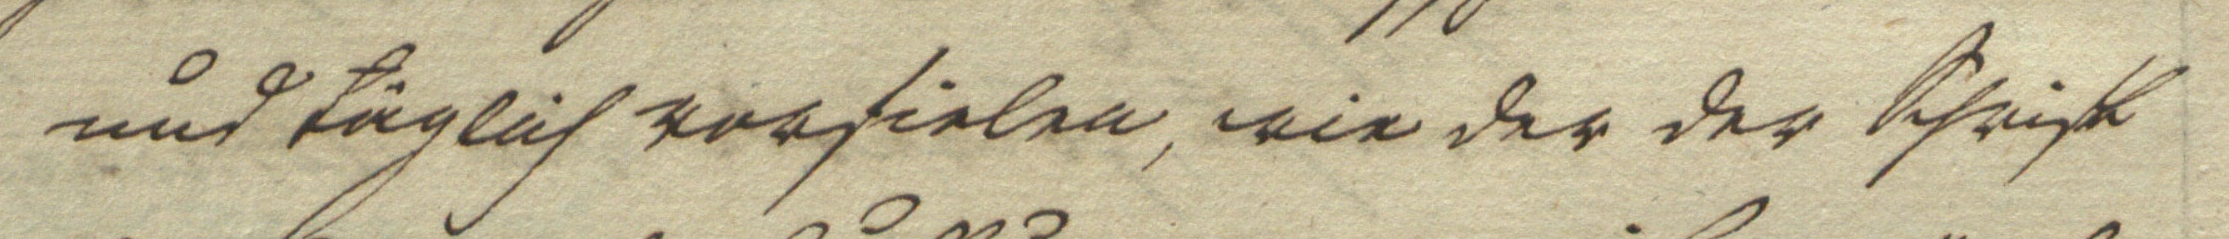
und täglich vorfielen, wie der Schriftl.
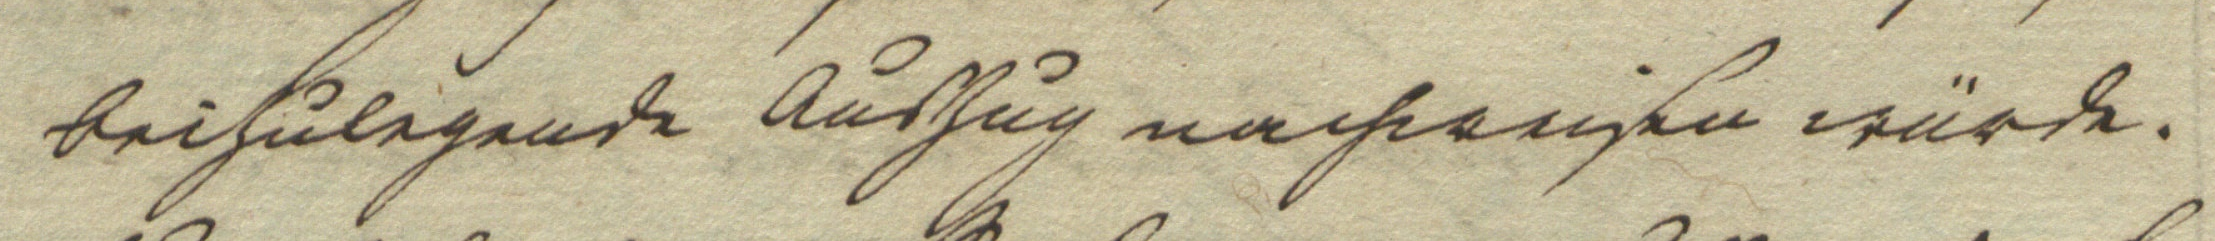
beizulegenden Auszug nachweisen würde.
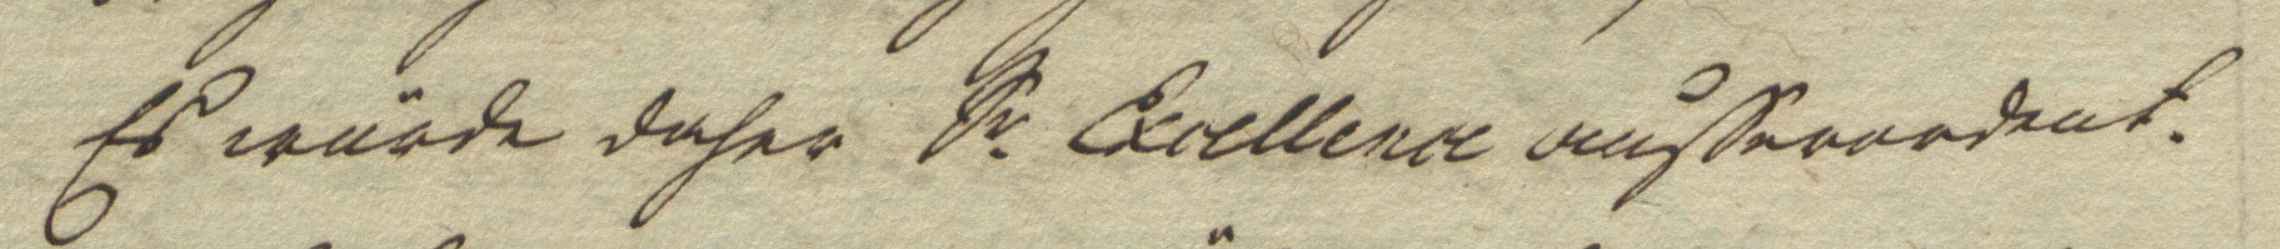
Es würde daher Sr. Excellence ausserordent¬
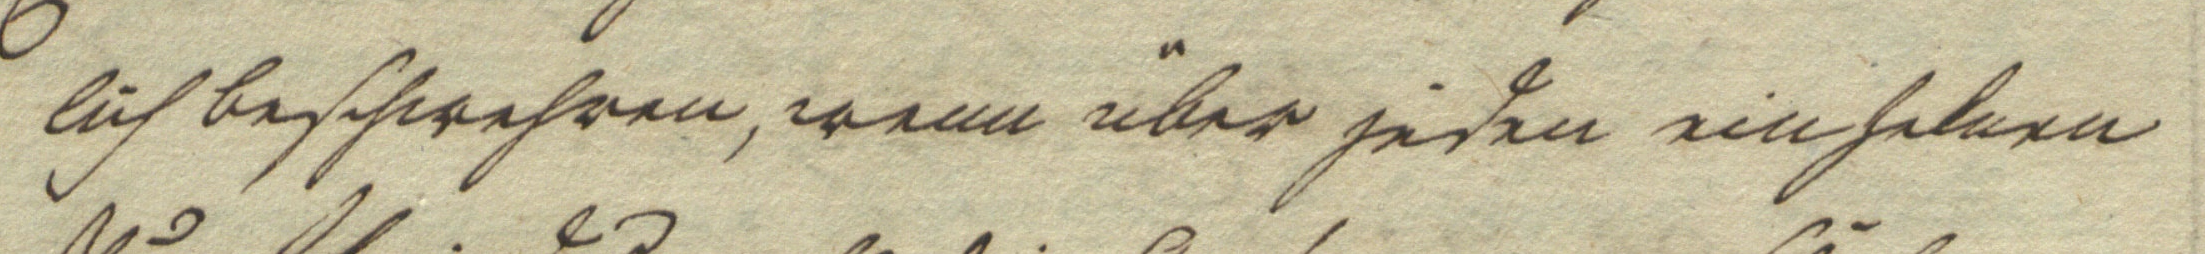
lich beschwehren, wenn über jeden einzelnen
